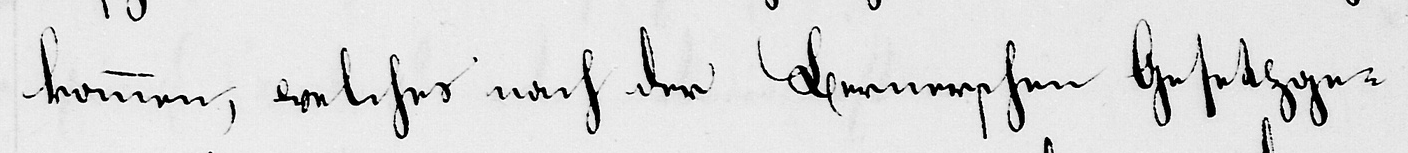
kommen, welches nach der Bernerschen Gesetzge¬
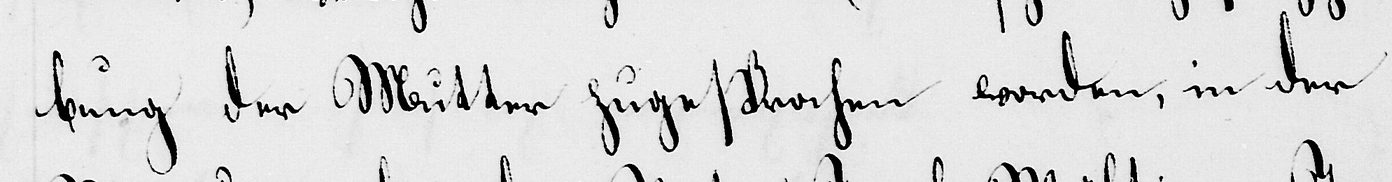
bung der Mutter zugesprochen worden, in der
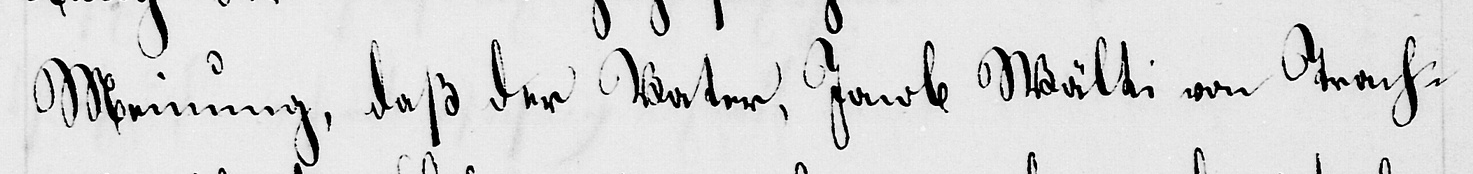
Meinung, daß der Vater, Jacob Wälti von Trach¬
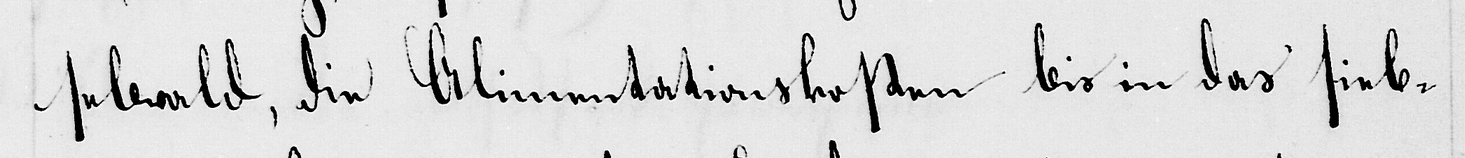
selwald, die Alimentationskosten bis in das sieb¬
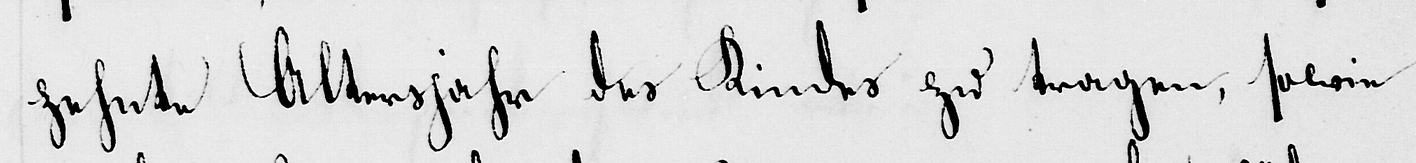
zehnte Altersjahr des Kindes zu tragen, sowie
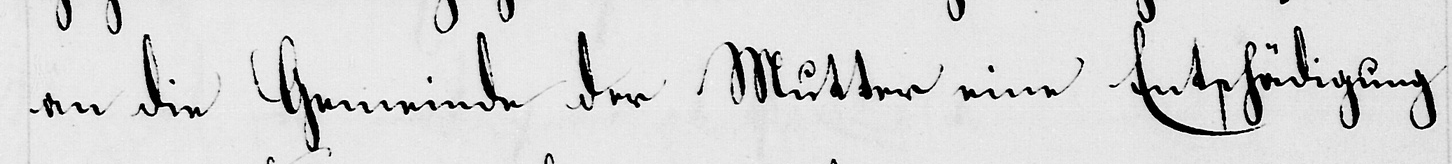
an die Gemeinde der Mutter eine Entschädigung
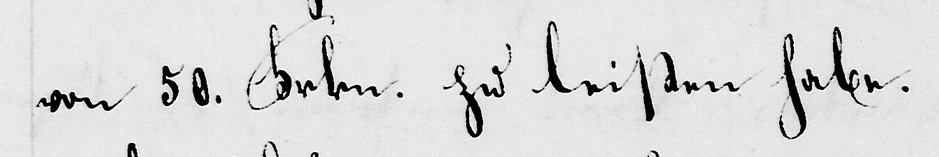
von 50. Frkn. zu leisten habe.
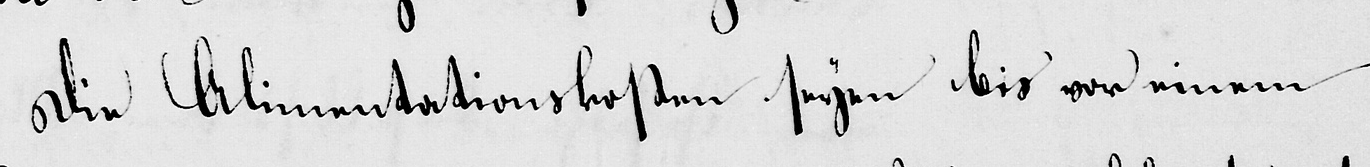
Die Alimentationskosten seyen bis vor einem
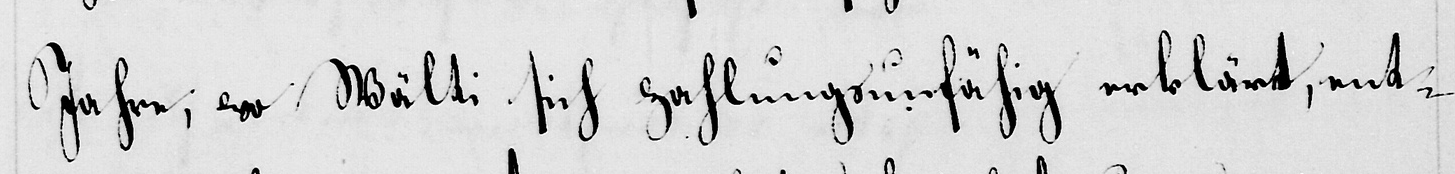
Jahre, wo Wälti sich zahlungsunfähig erklärt, ent¬
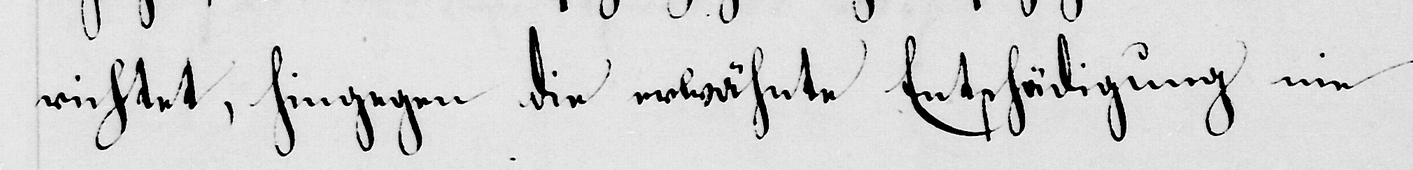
richtet, hingegen die erwähnte Entschädigung nie
